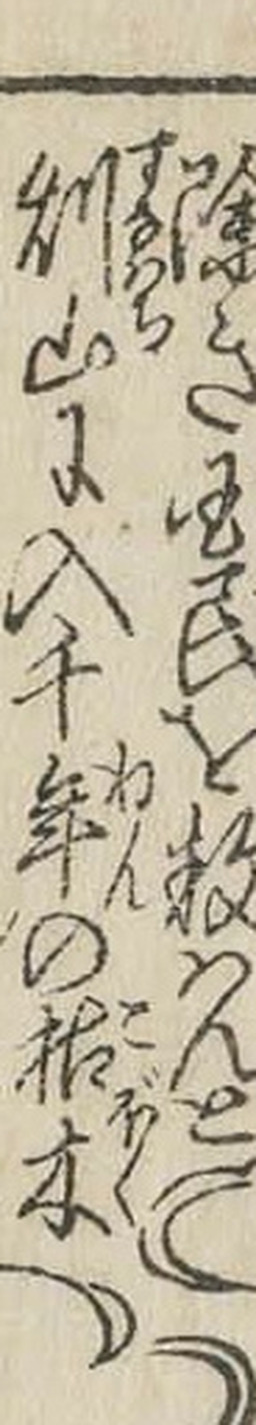則山に入千年の枯木
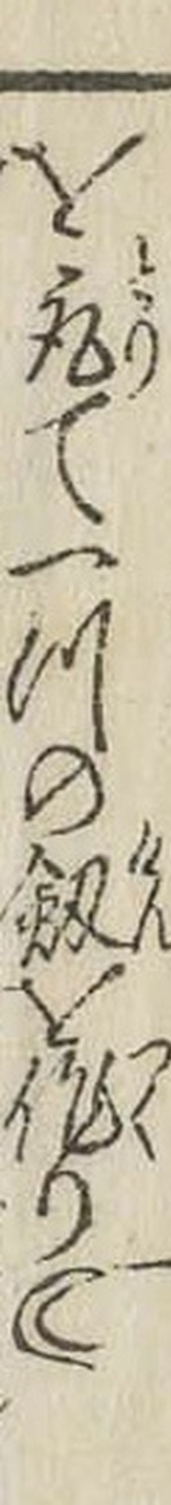を取て一つの剣を作り
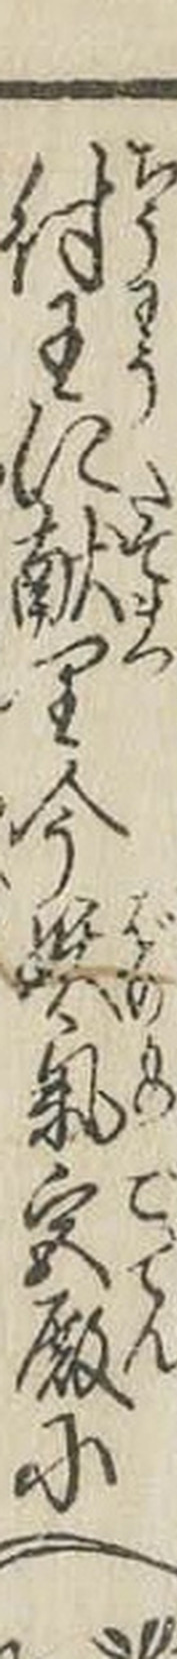紂王に献り今妖気宮殿に
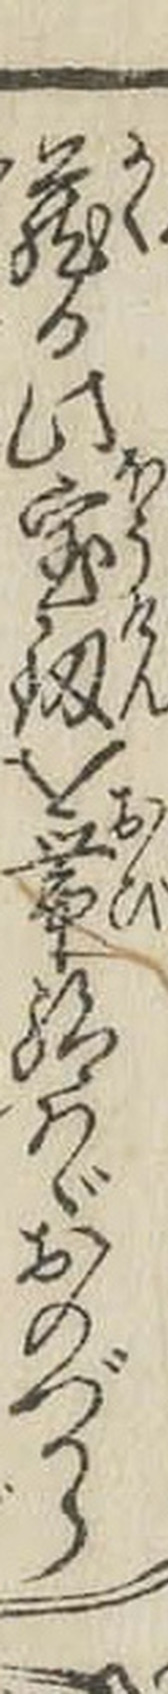蔵る此宝剣を帯給はゞおのづから
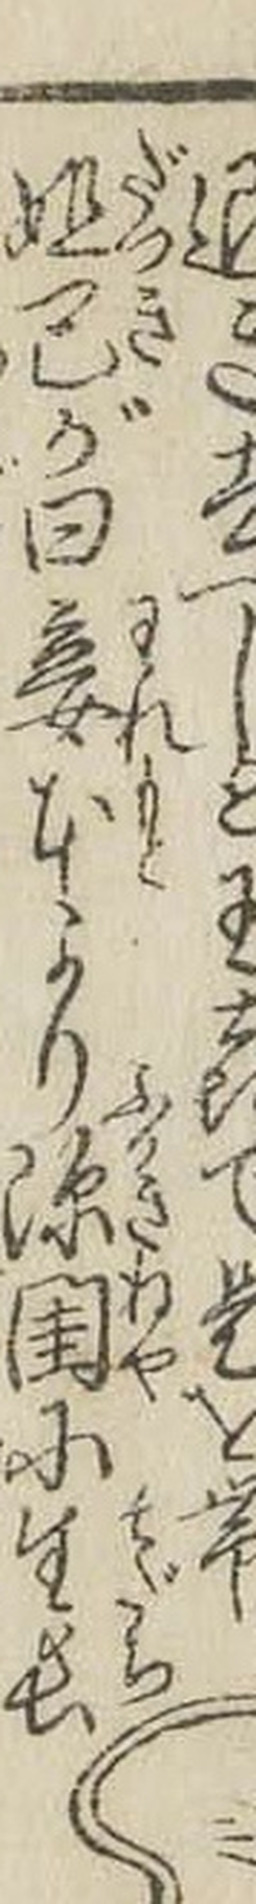妲己が曰妾本より深閨に生長
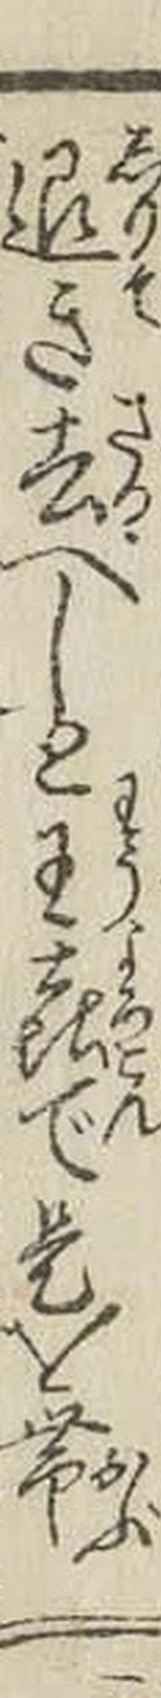退き去べしと王喜で是を帯
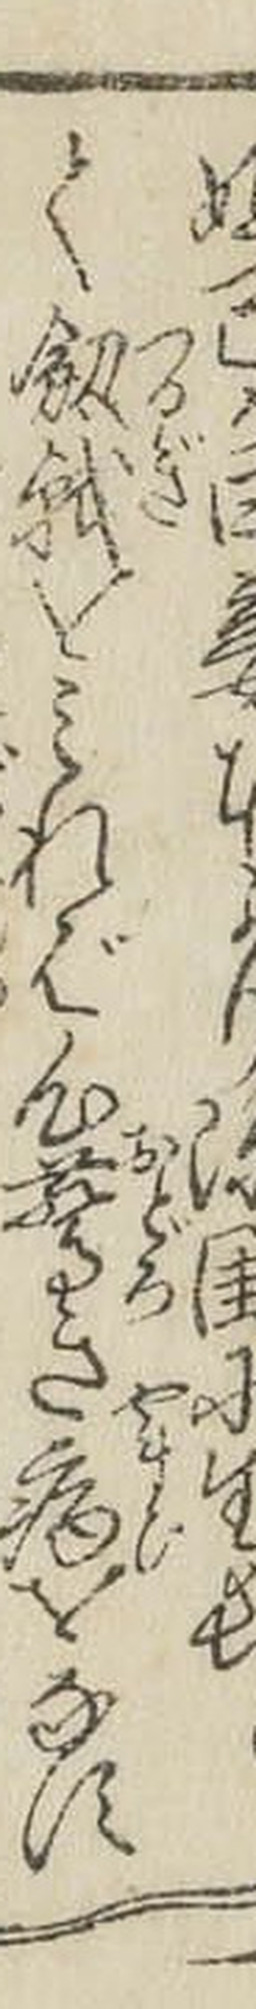て剣戟をみれば心驚き病をなす
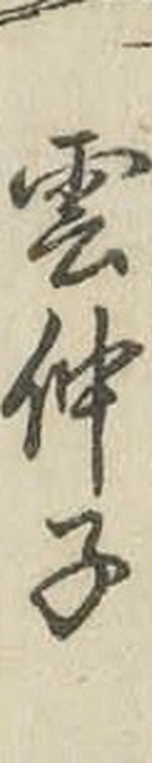雲仲子
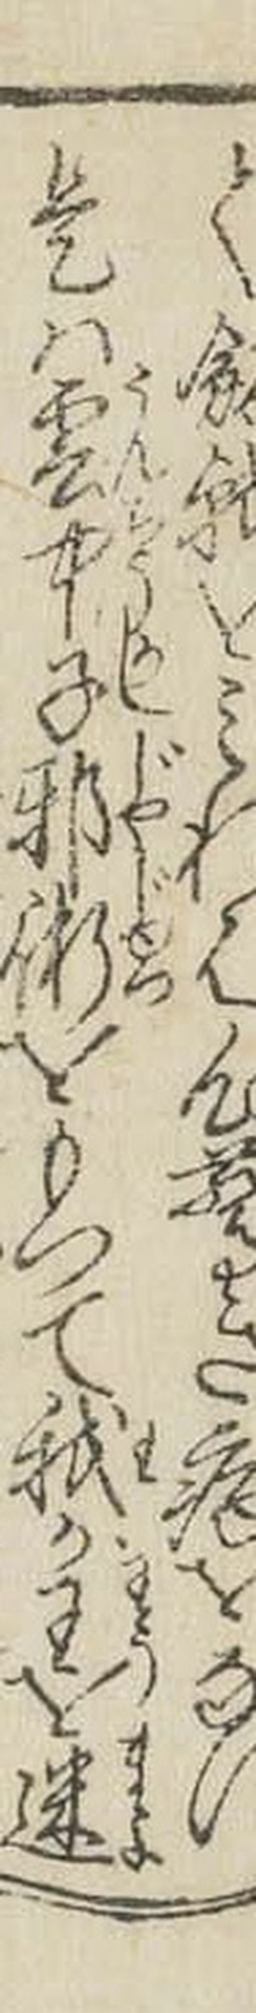是は雲中子邪術をもつて我か王を迷
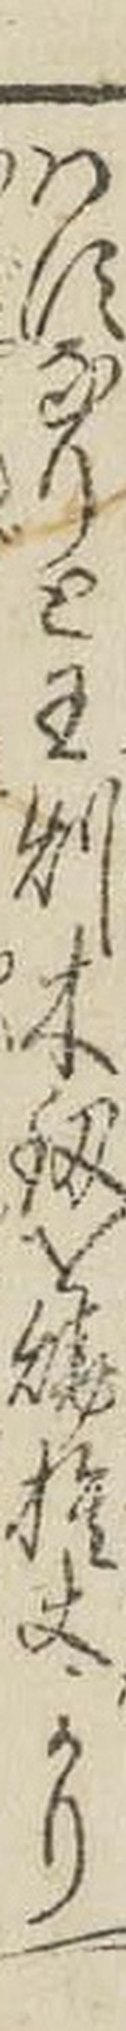はすなりと王則木剣を焼捨夫より
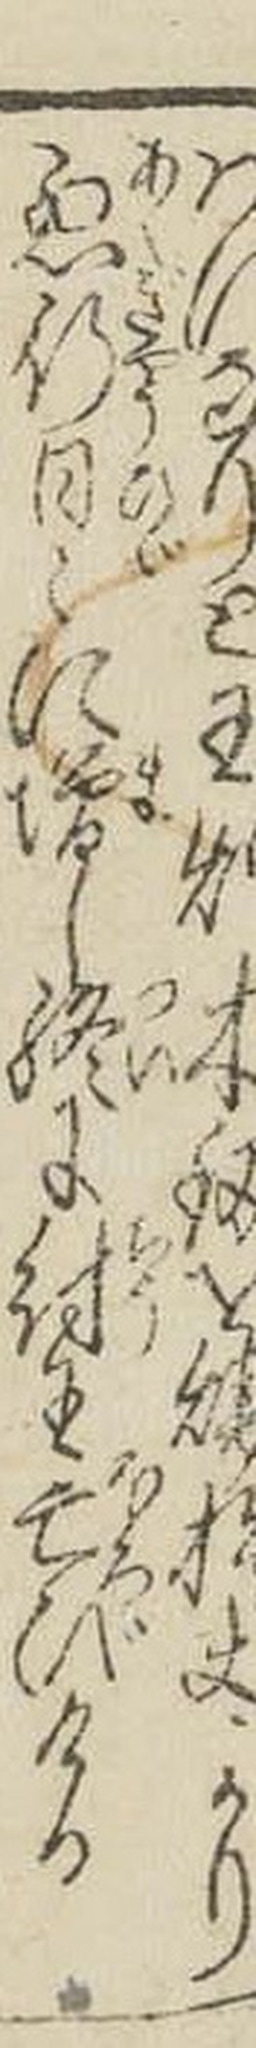悪行日々に増し終に紂王亡びける
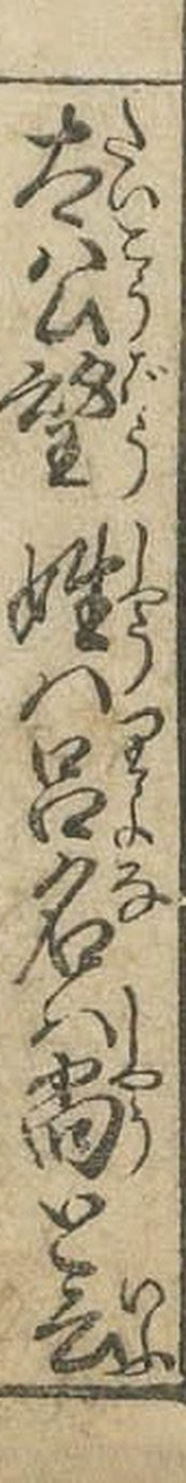太公望姓は呂名は尚と云
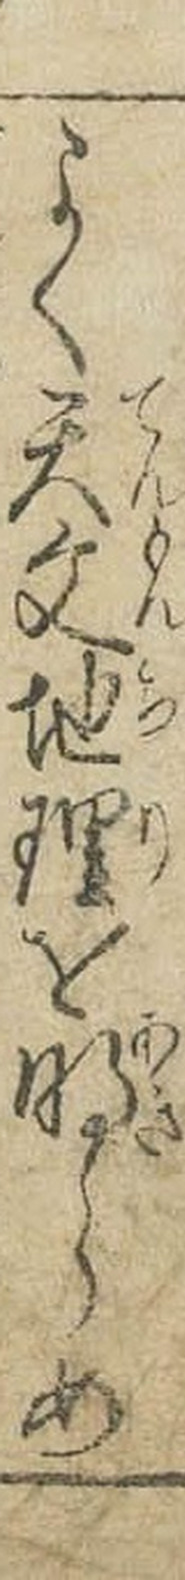よく天文地理を明らめ
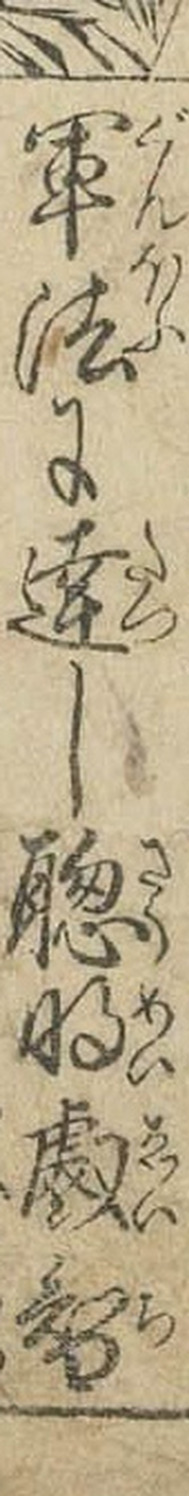軍法に達し聡明叡智
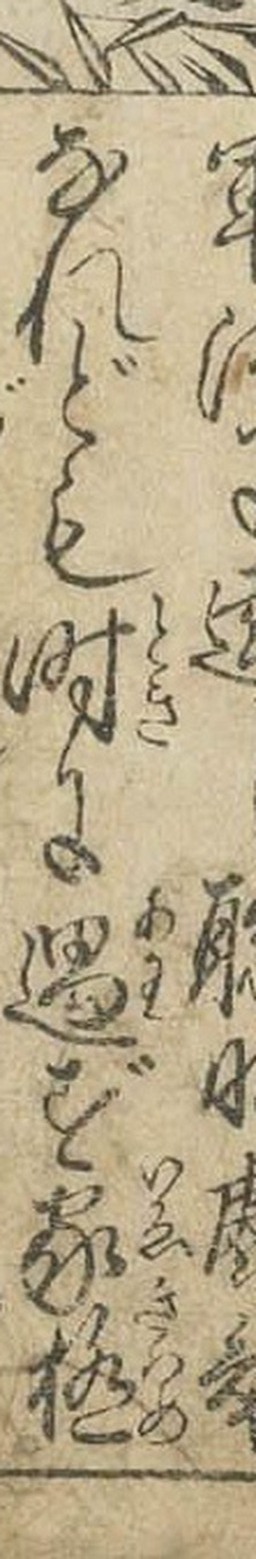なれども時に遇ず家極
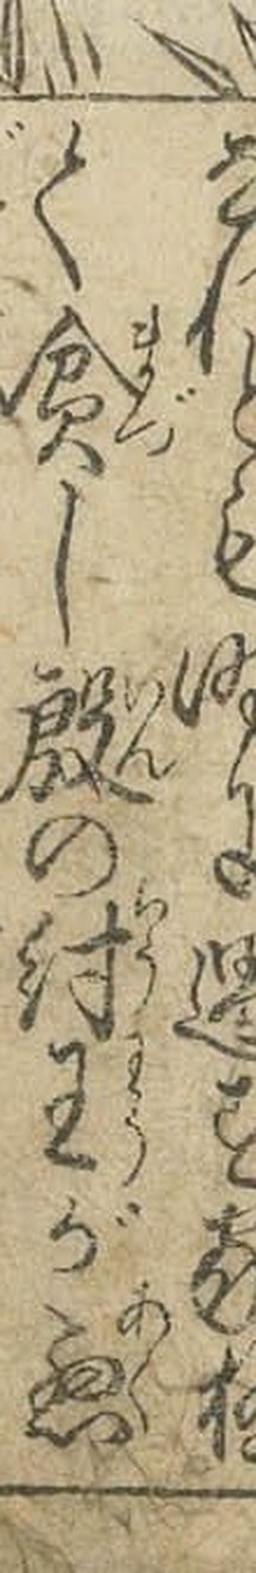て貧し殷の紂王が悪
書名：絵本写宝袋 9巻 4之巻
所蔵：東京学芸大学教育コンテンツアーカイブ
